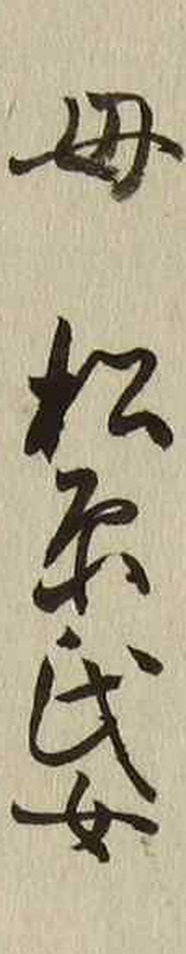母松原氏女
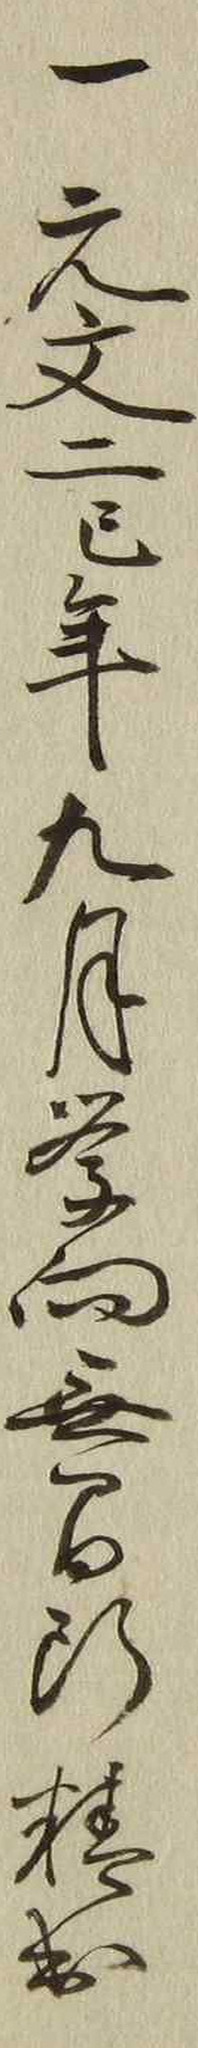一元文二巳年九月学向無間断精出
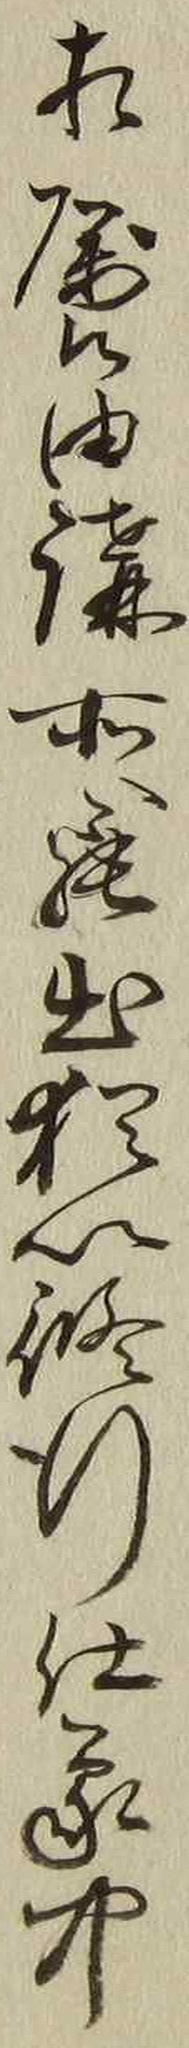相属候由講所へ罷出猶以修行仕蒙中
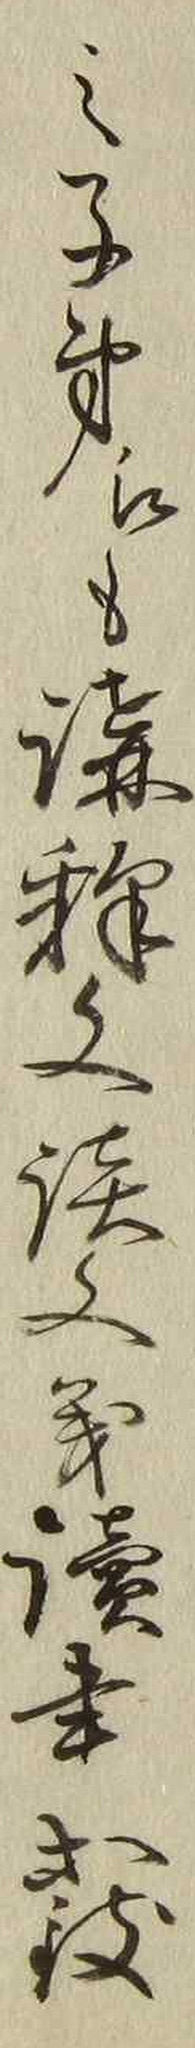之子弟江も講釈又談又義読書等致
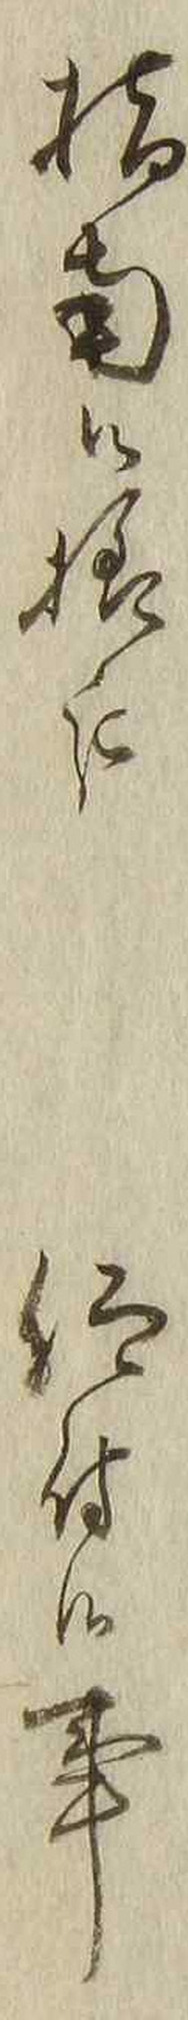指南候様被仰付候事
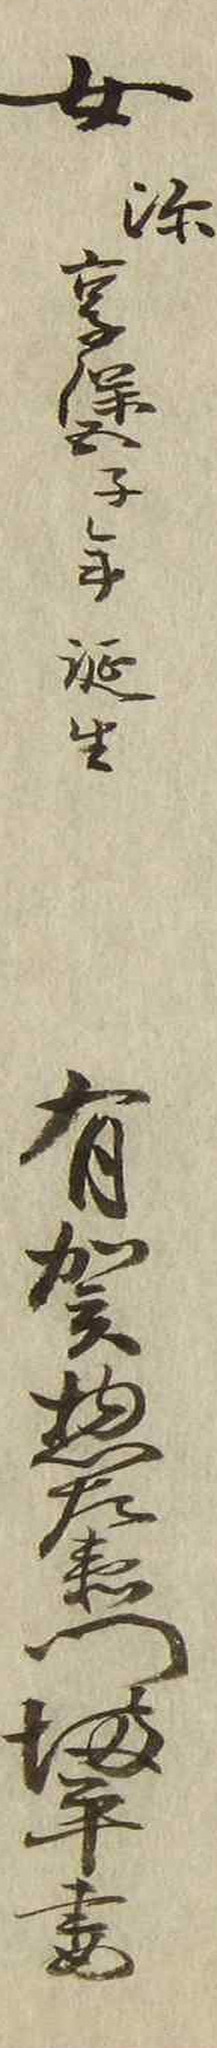女添享保五子年誕生有賀惣左衛門満平妻

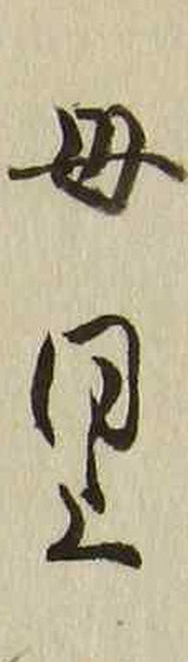母同上
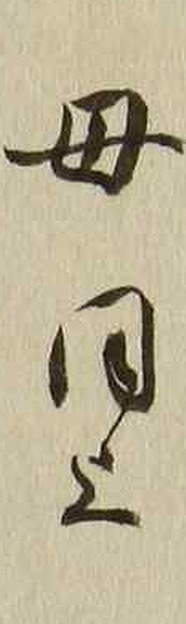母同上
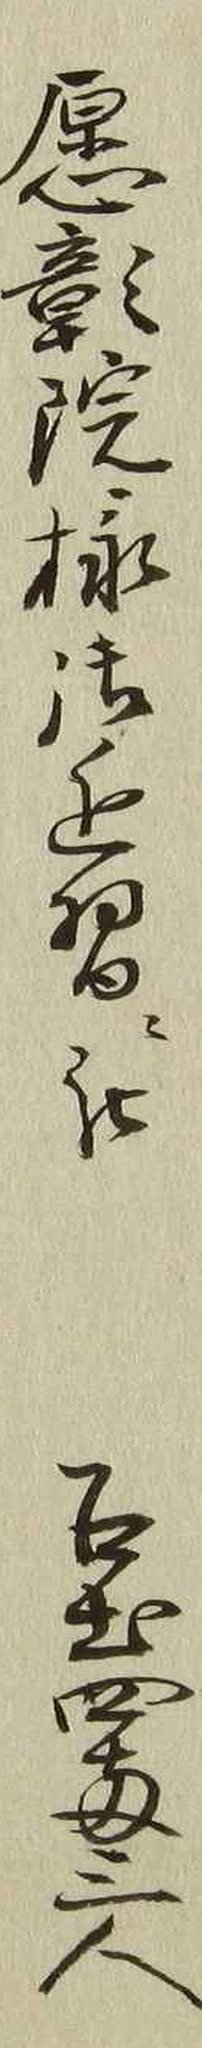愿彰院様御近習ニ被召出四両三人
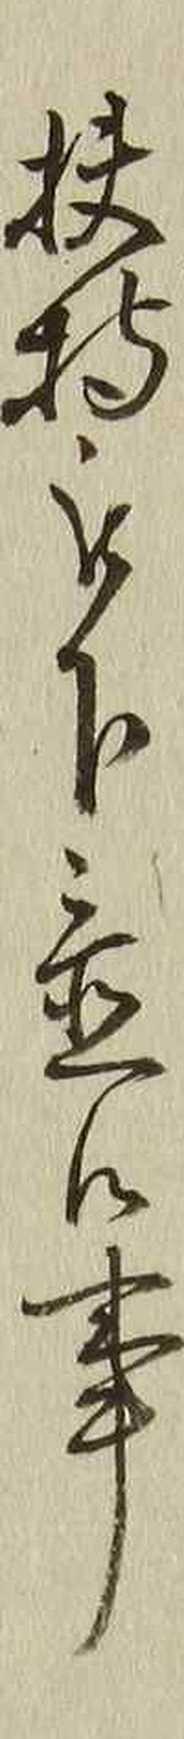扶持被下置候事
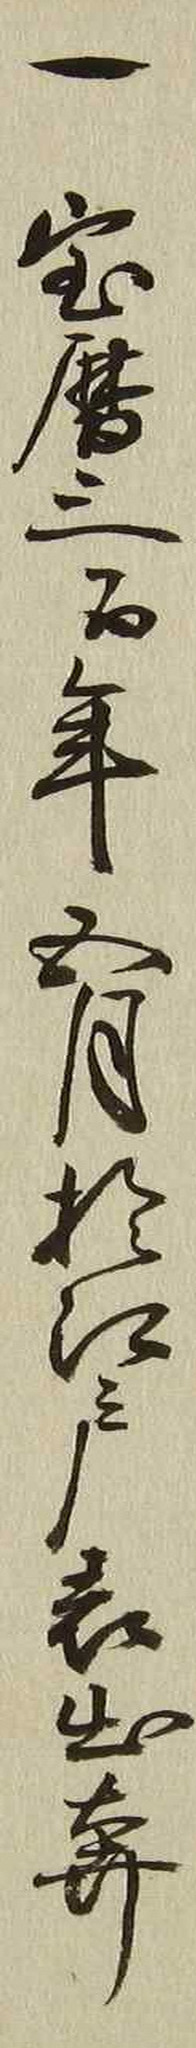一宝暦三酉年五月於江戸表出奔
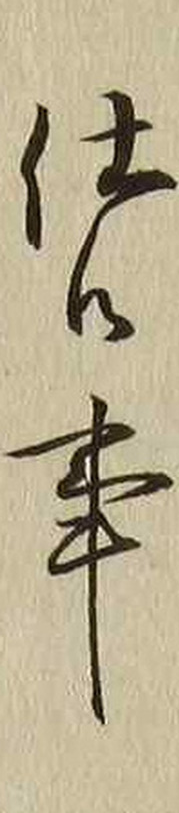仕候事
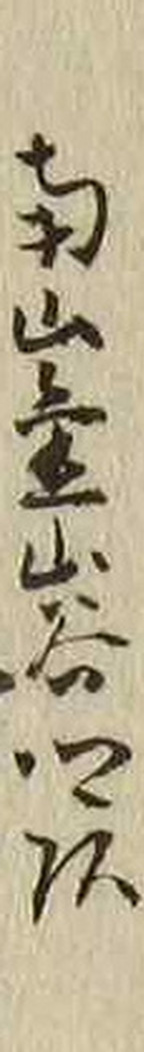南山金山谷卿頭
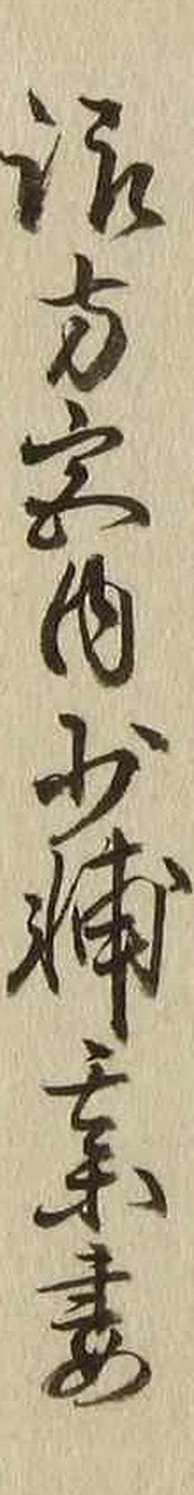諏方宮内少輔某妻
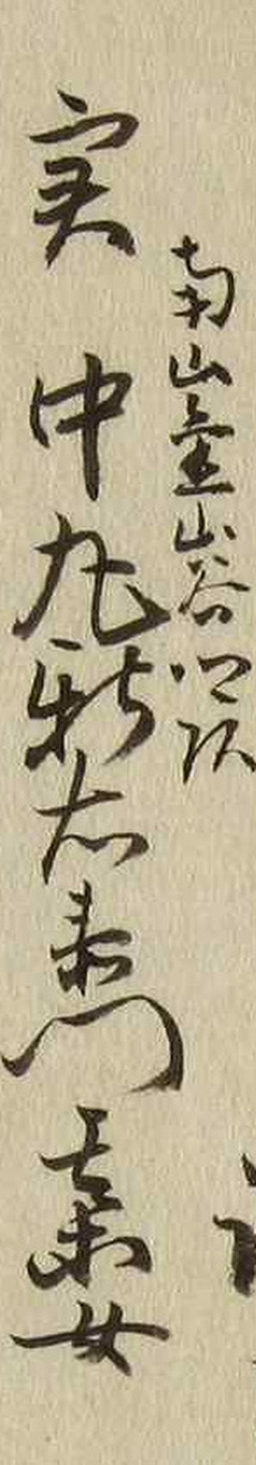実中丸親右衛門某女
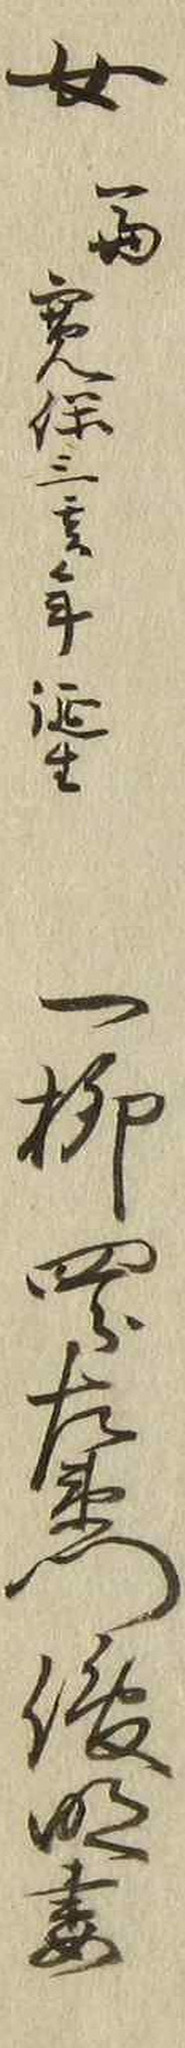女一福寛保三亥年誕生一柳四郎左衛門俊明妻
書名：諸士系譜　巻之60　と之部3
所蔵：会津若松市立会津図書館
